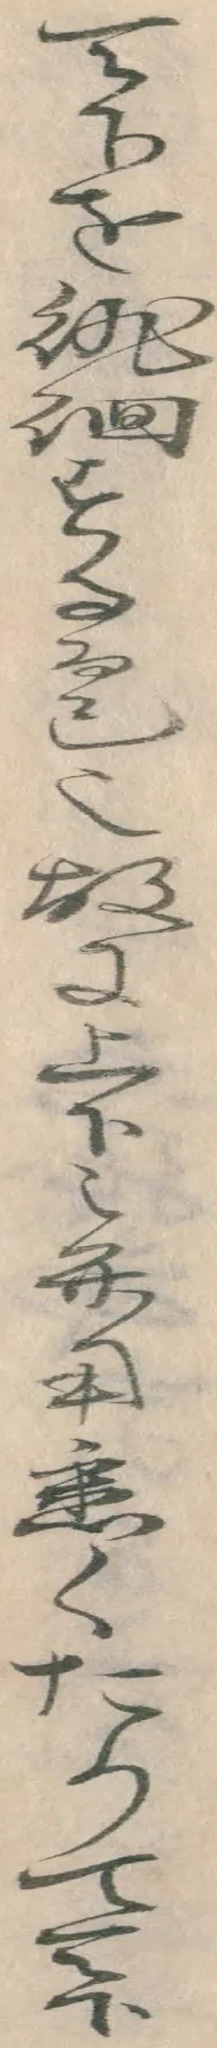天下を徘徊する而己也故に上下之弁用悉くたりて天下
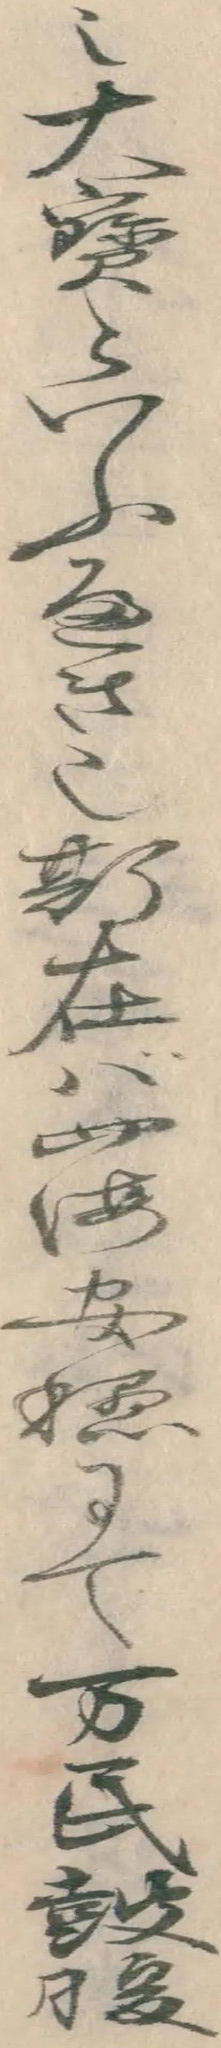之大宝といふへき也斯在ば四海安穏にて万民鼓腹
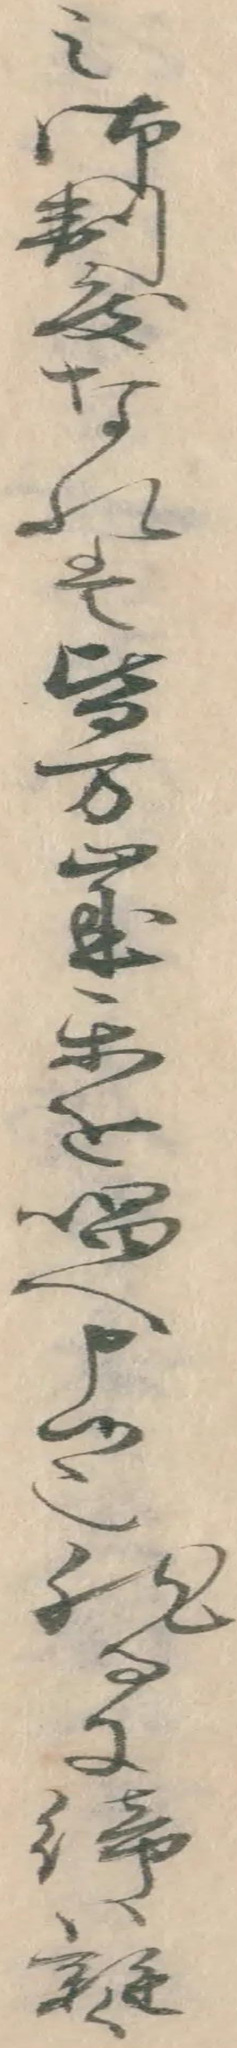之御制度なれは皆万歳楽を唱へ申候也然るに締は難く

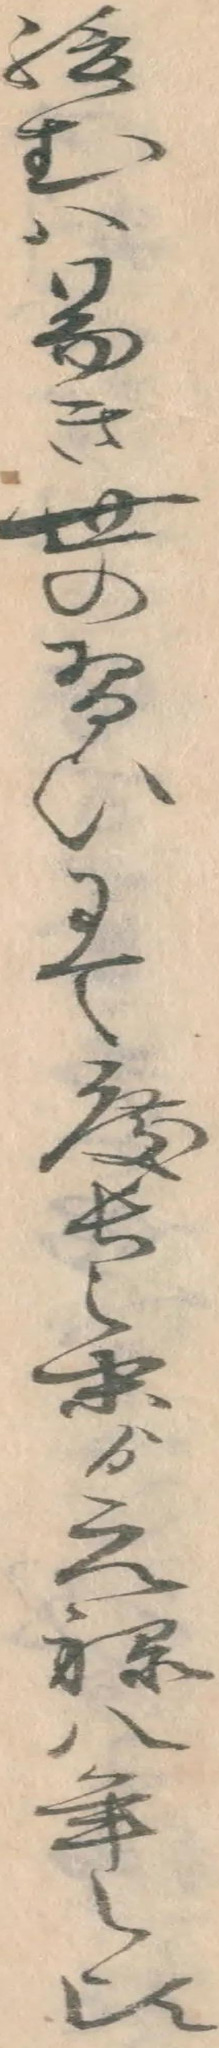緩むは易き世の習ひにて慶長之末ゟ元禄八年之頃
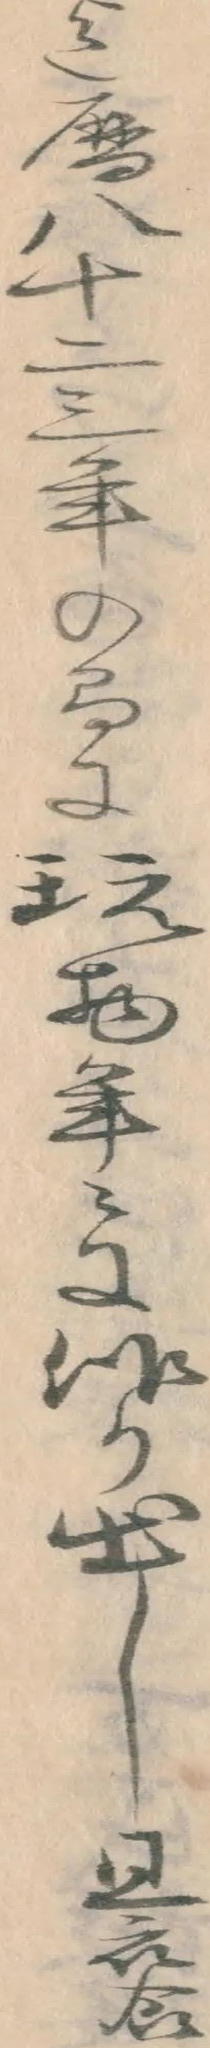迄暦八十二三年の間に玩物年々に作り出し且衣食
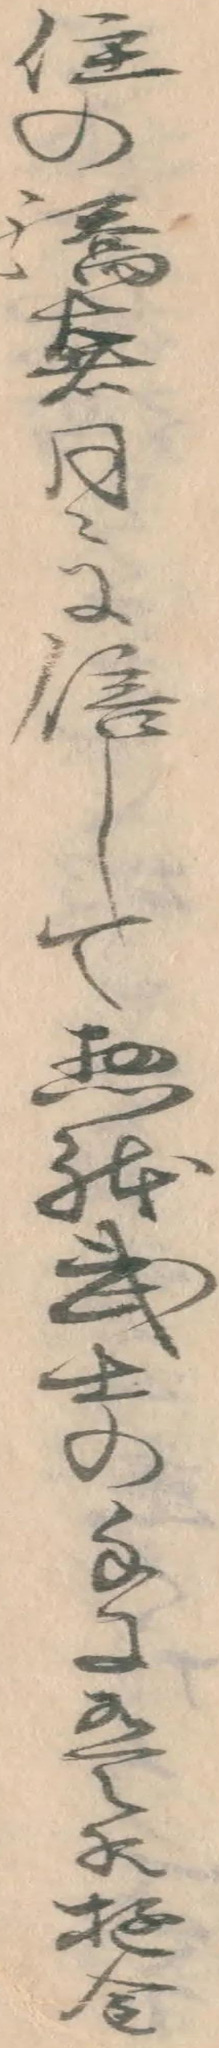住の驕奢月々に倍して惣体武士の手に有之候遊金
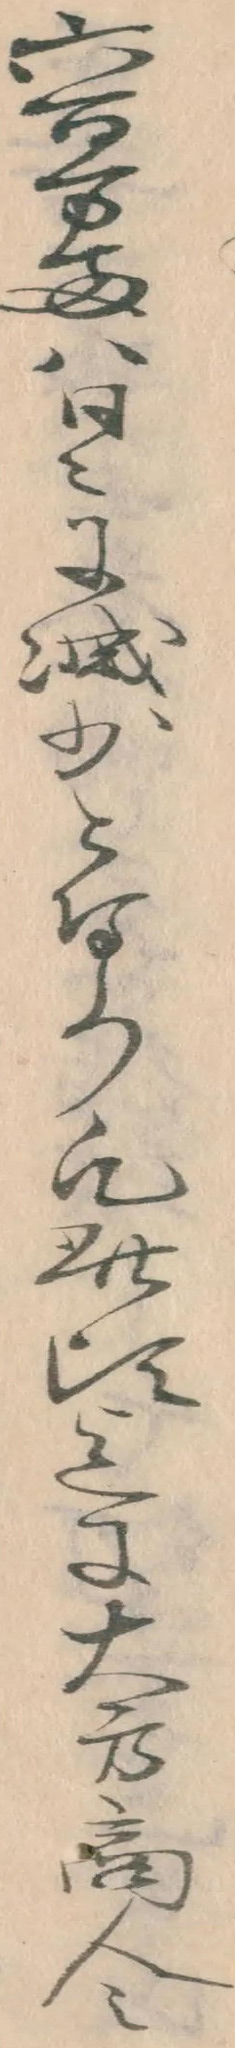六百万両は日々に減少となり凡此頃迄に大方商人之
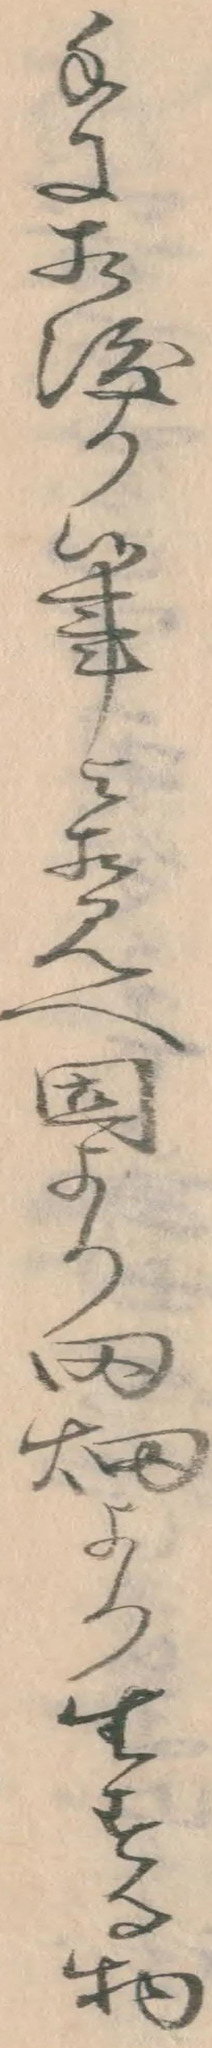手に相渡り候事と相見へ固より田畑より生する物
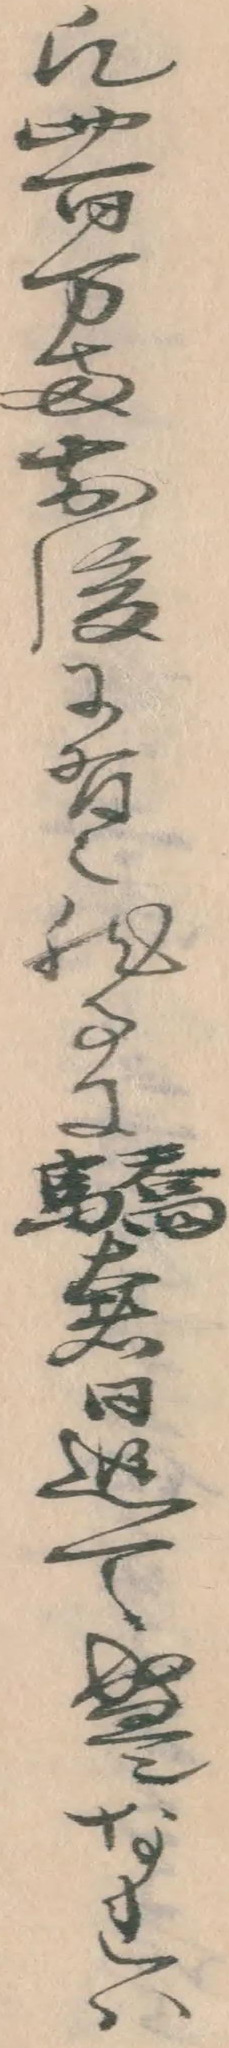凡四百万両前後に有之然るに驕奢日追て盛になれは
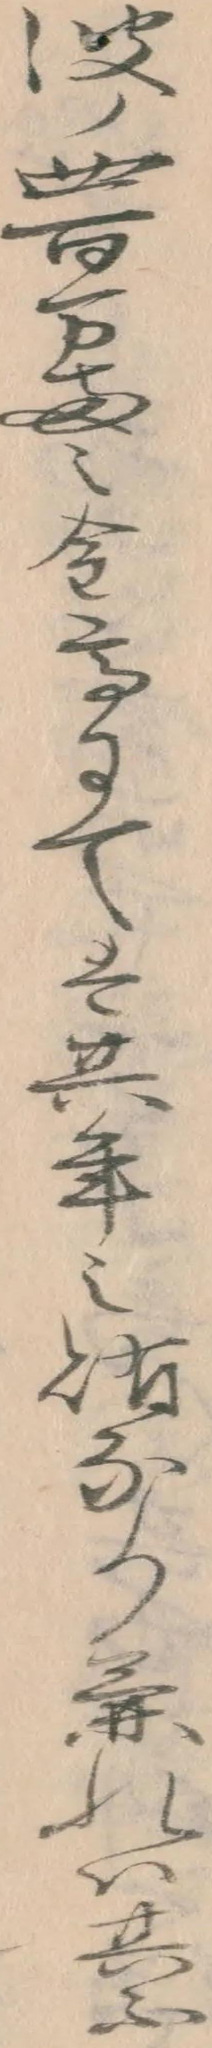彼の四百万両之金高にては其年之賄なり兼れは其不
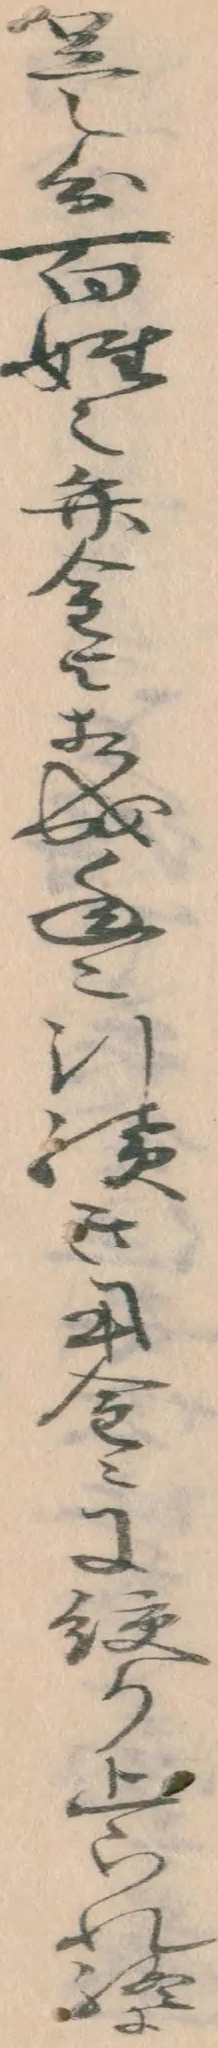足之分百姓之弁金と相成年々引続き用金々に絞り上られ終に
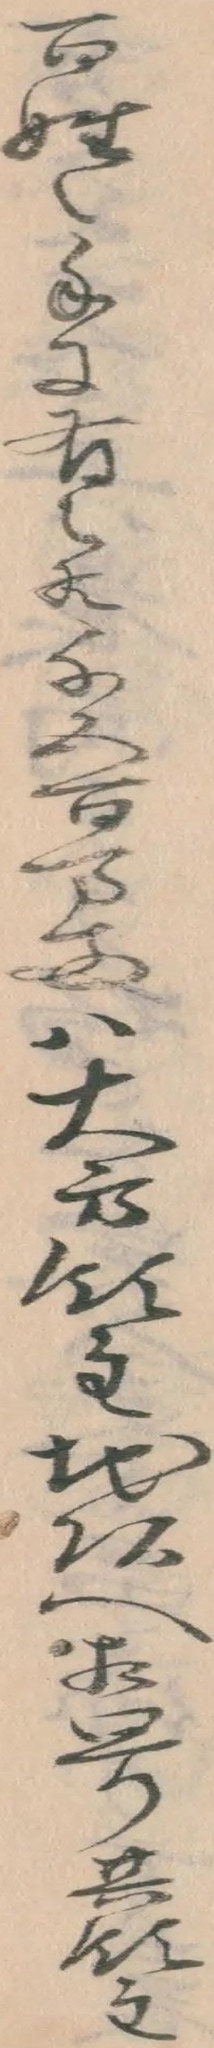百姓之手に有之候千五百万両は大方領主地頭へ相廻り其領主
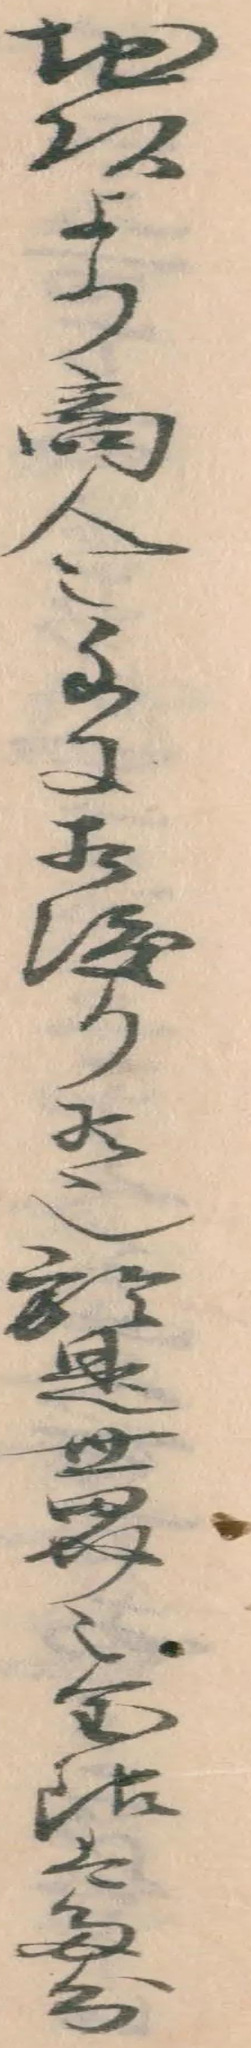地頭より商人之手に相渡り候也於是世界之金銀は多分
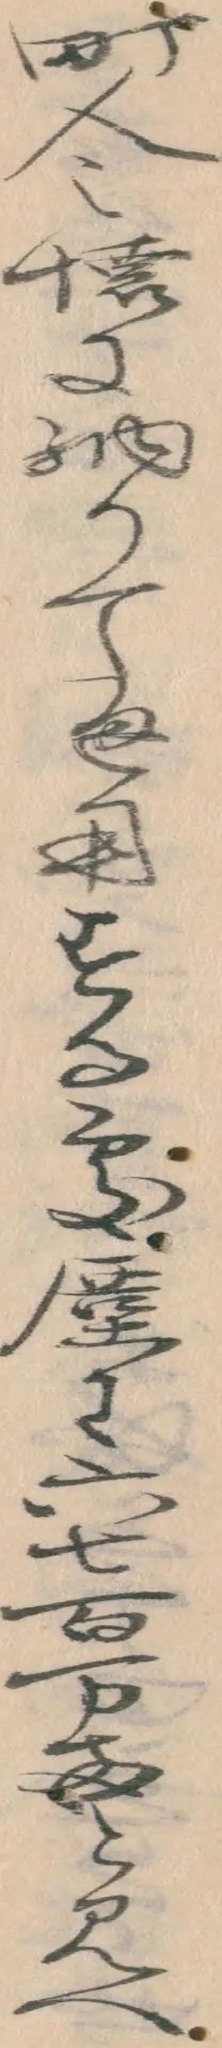町人之懐に納りて通用する処厪？に六七百万両と見へ
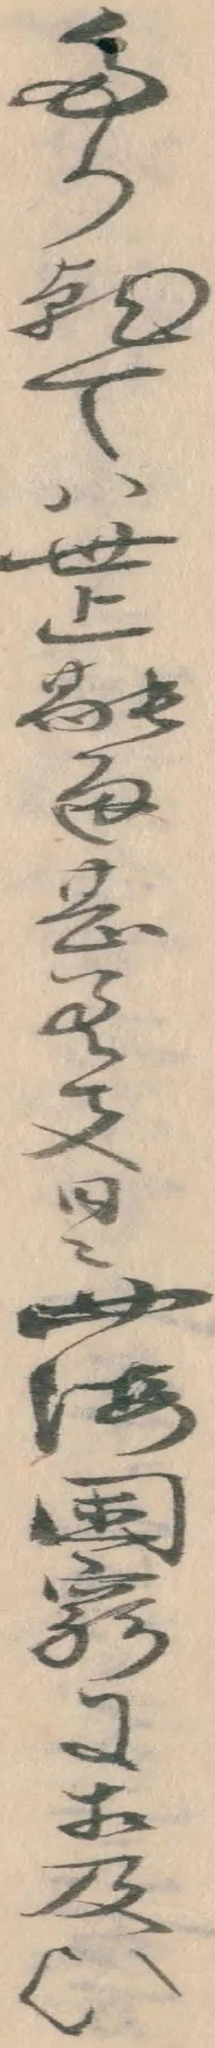たり就ては世上融通甚差支日々四海困窮に相及ひ
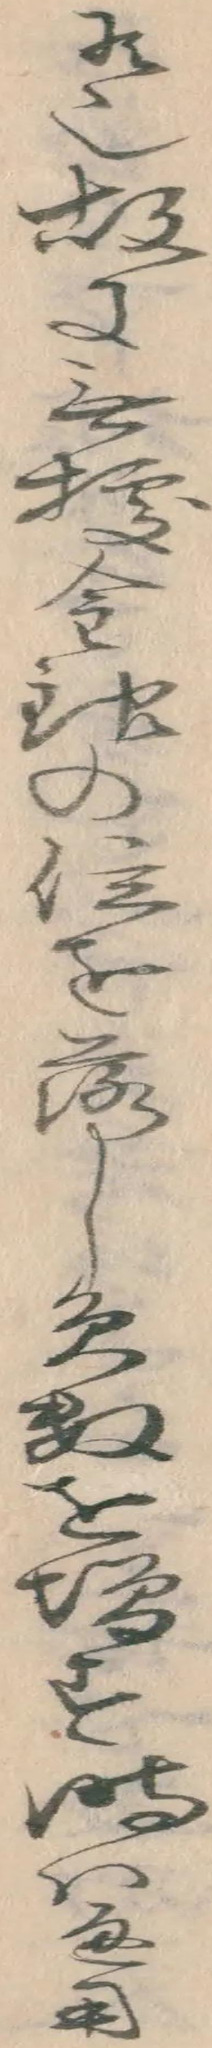候也故に無拠金銀の位を落し員数を増す時は通用
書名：斎庭之穂
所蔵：国立国会図書館 National Diet Library, JAPAN
